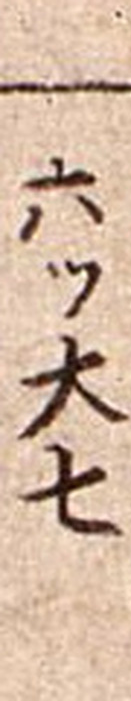六つ大七
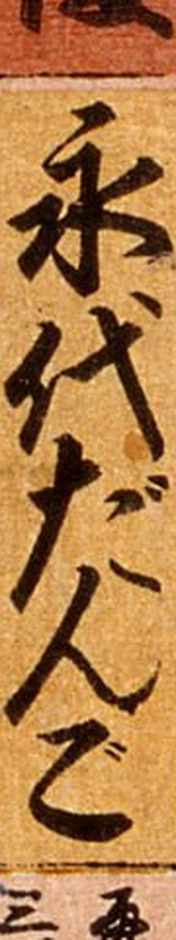永代だんご
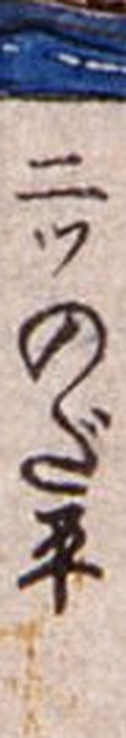二つのだ平
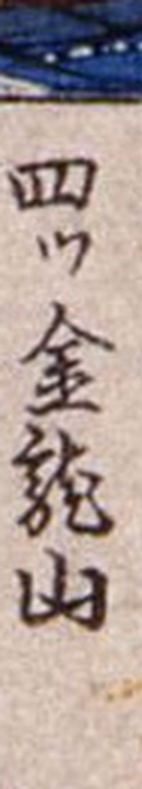四つ金龍山
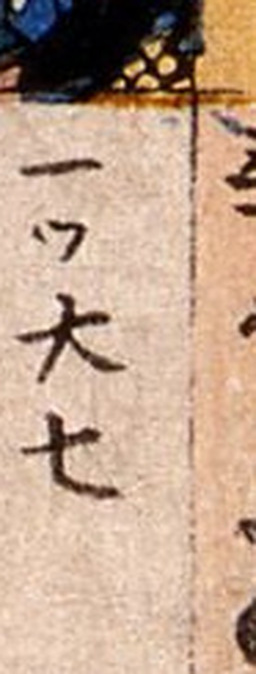一つ大七
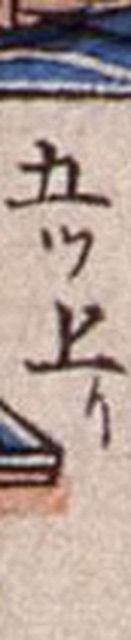五つ上り
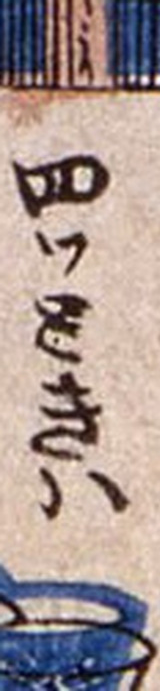四つときは
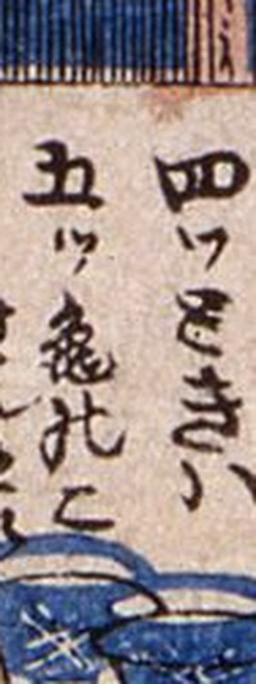五つ重のし
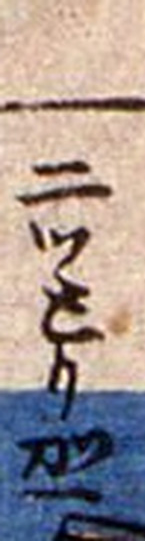二つ上り
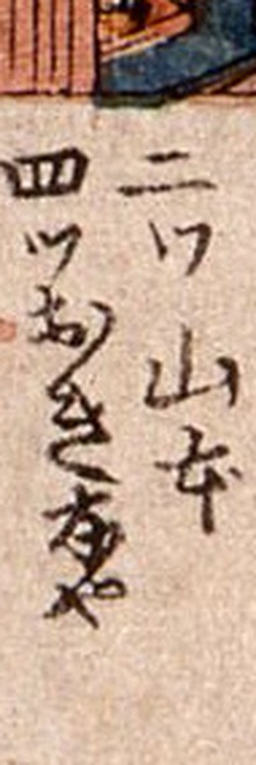四つおきなや
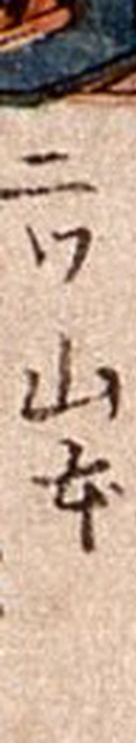二つ山本
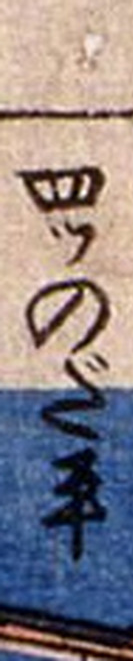四つのだ平
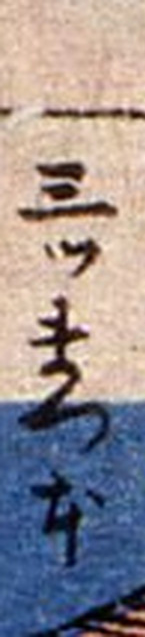三つまつ本
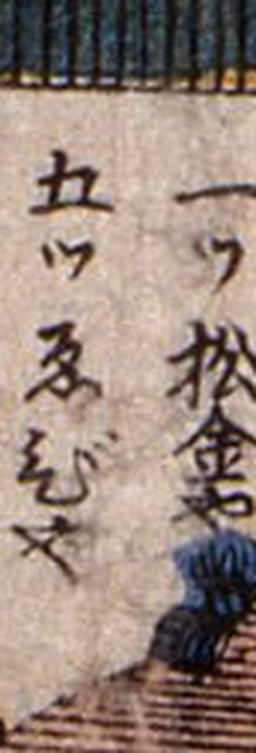五つゑびや
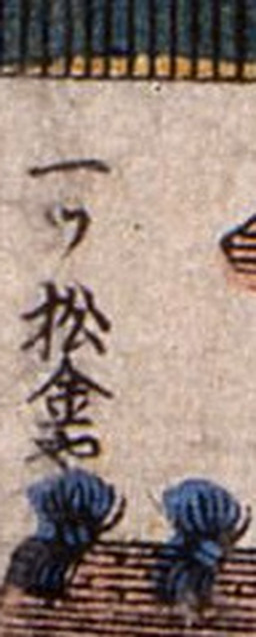一つ松金や
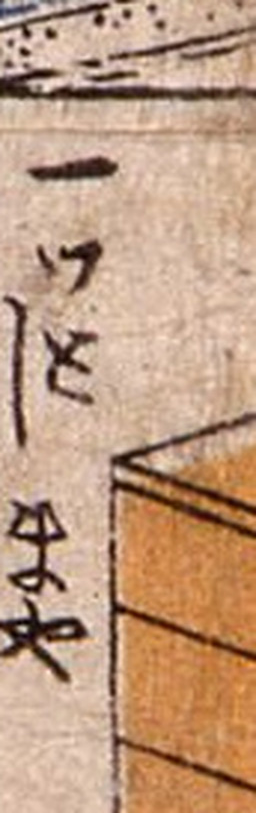一つとしまや
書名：新版御府内流行名物案内雙六
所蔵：東京学芸大学附属図書館
